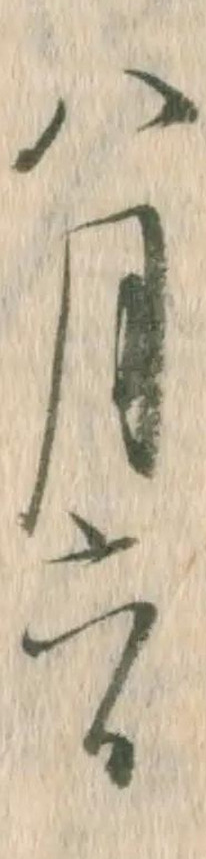八月六日

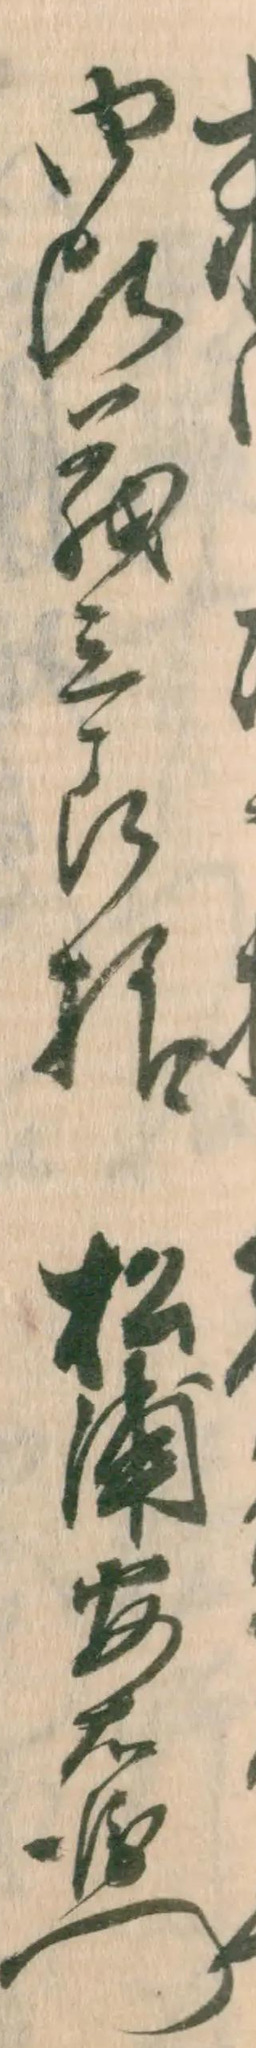由比義三郎様松浦安右衛門
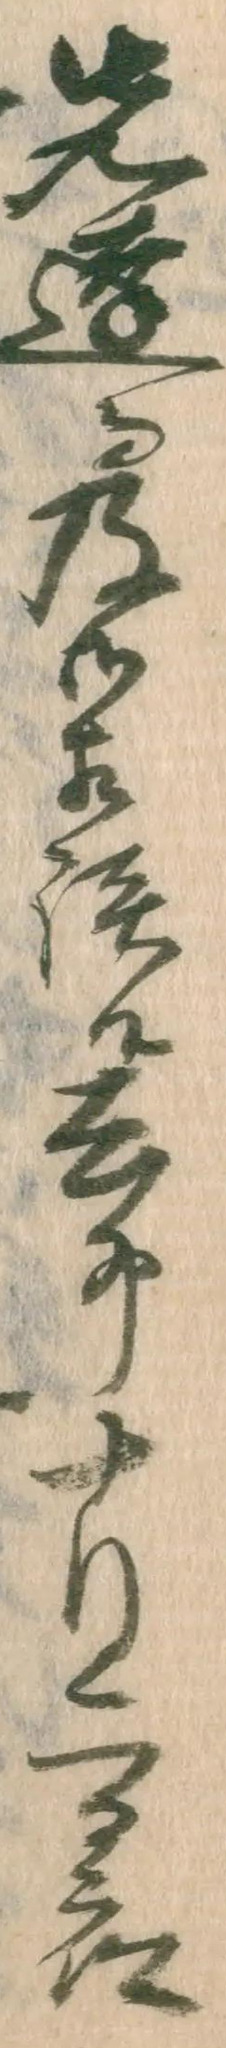先達て及御相談候去卯十月二日夜
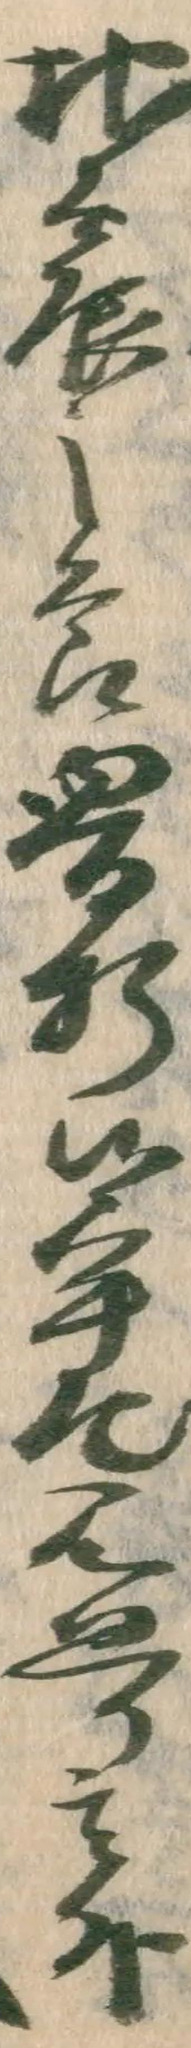地震之節骨折候牢屋見廻り其外
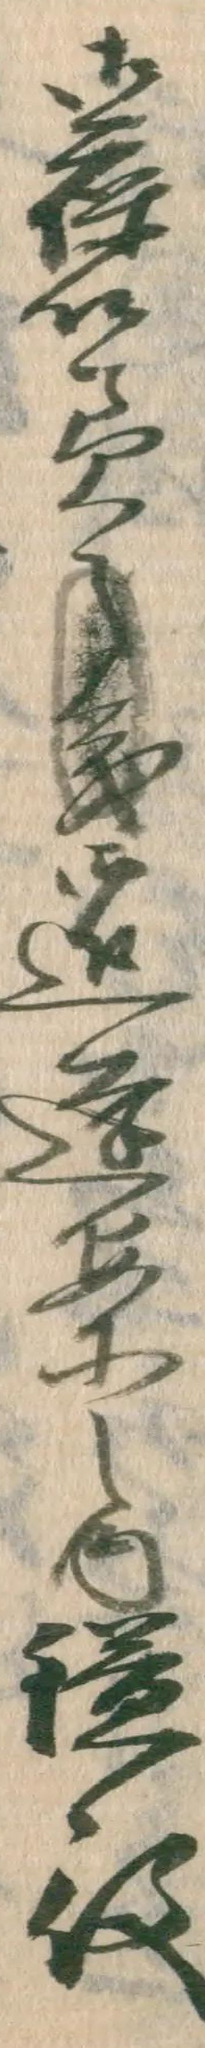御褒美之義御進達案之内鎰役
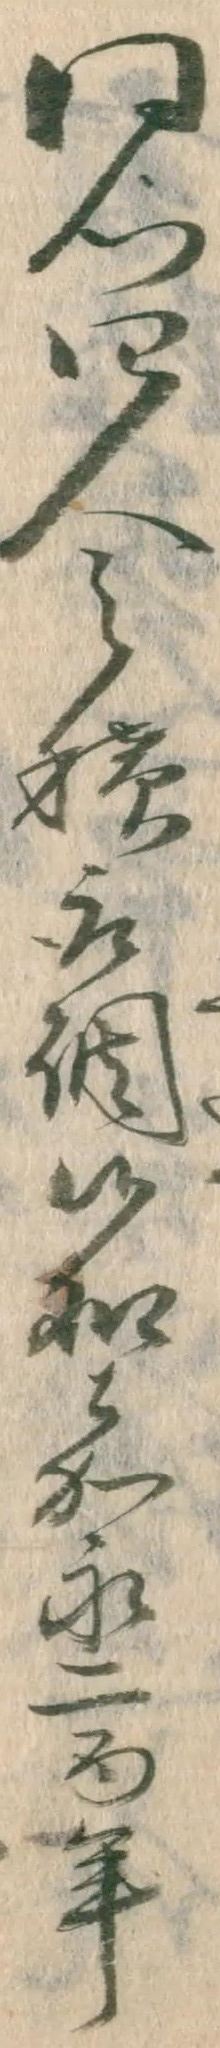同心四人之積取調候処嘉永二酉年
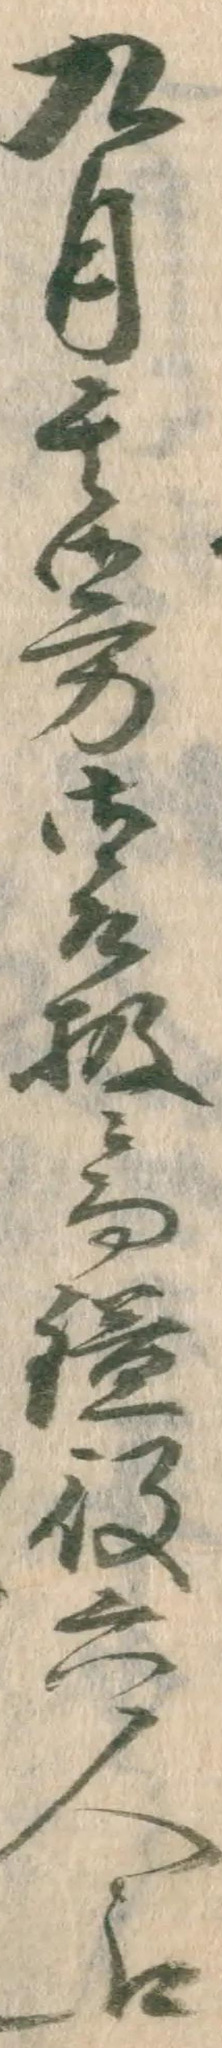九月其御方御取扱ニて鎰役六人え
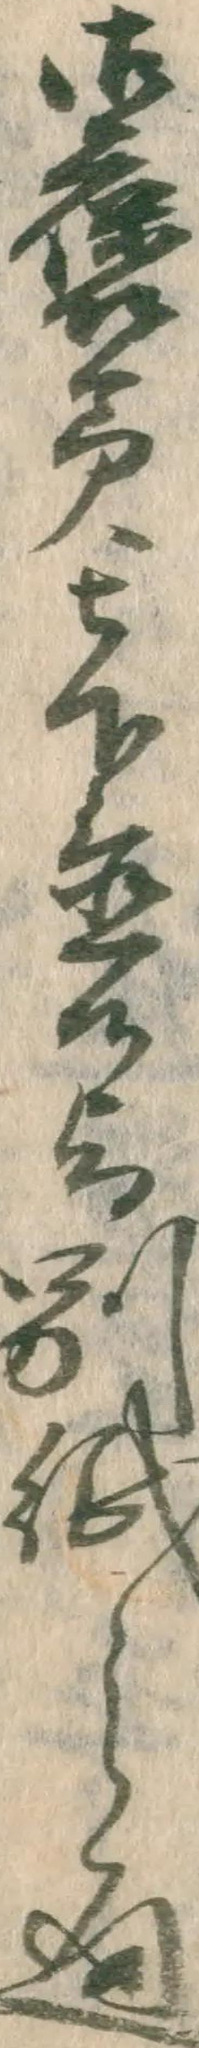御褒美被下置候旨別紙之通り
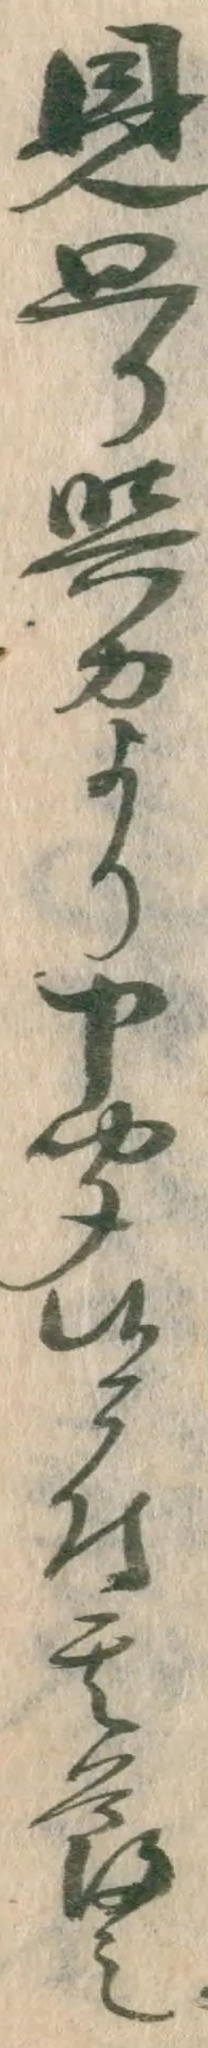見廻り与力より申聞候ニ付其節之

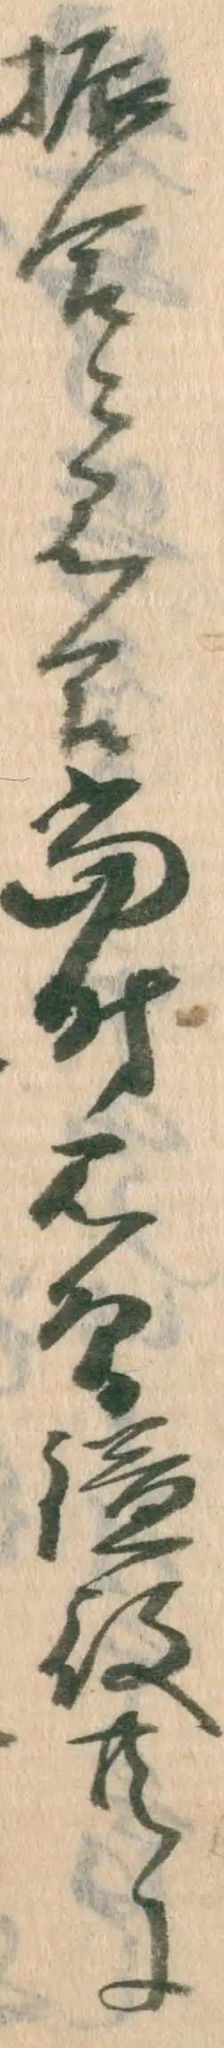振合ニ見合当時見習鎰役共に
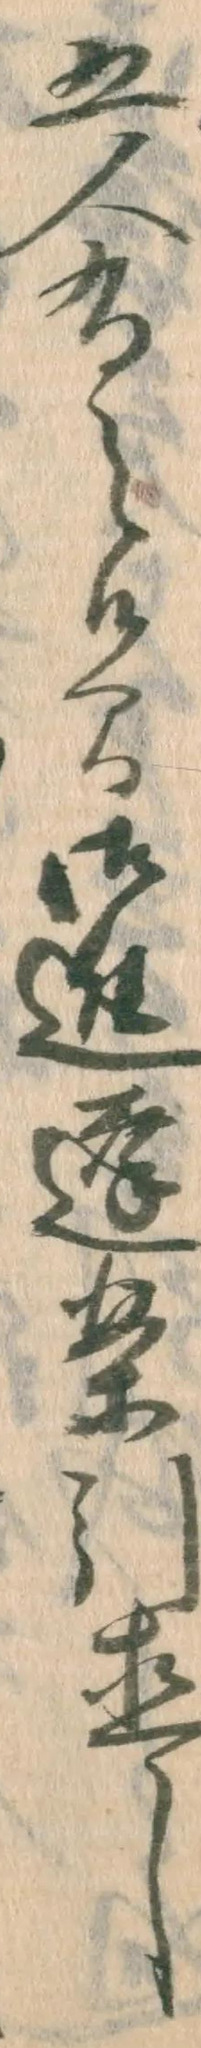五人有之候間御進達案引直し
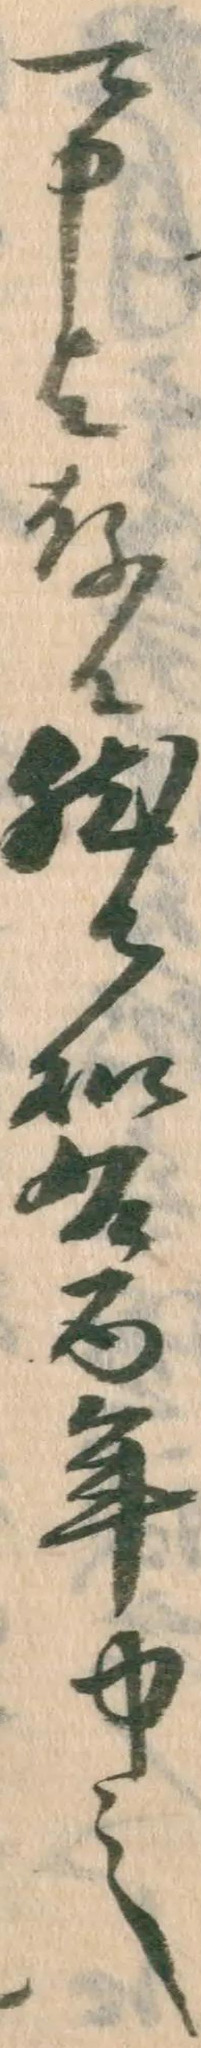可申と存候然ル処右酉年中之
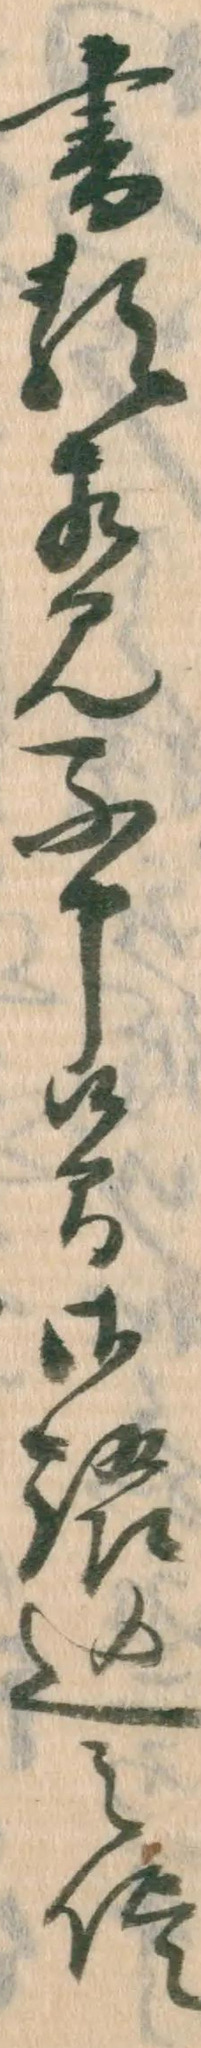書類相見不申候間御認込之儘
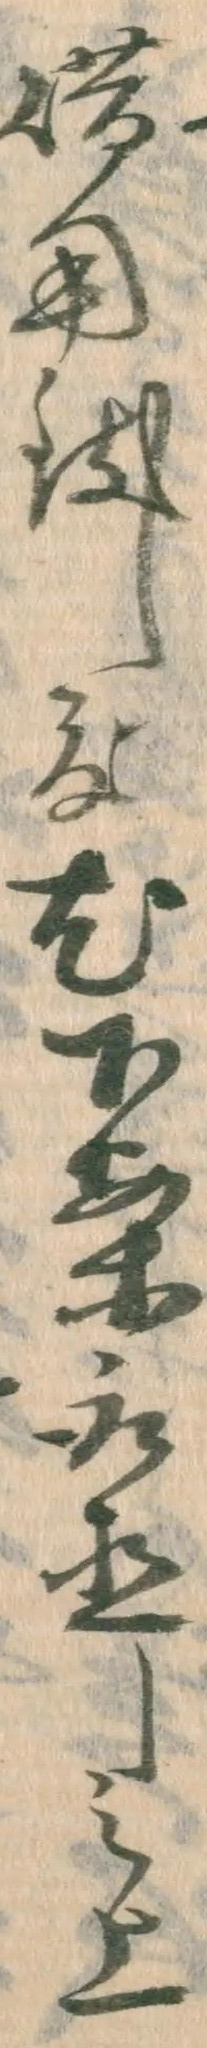借用致し度尤下案取直し之上
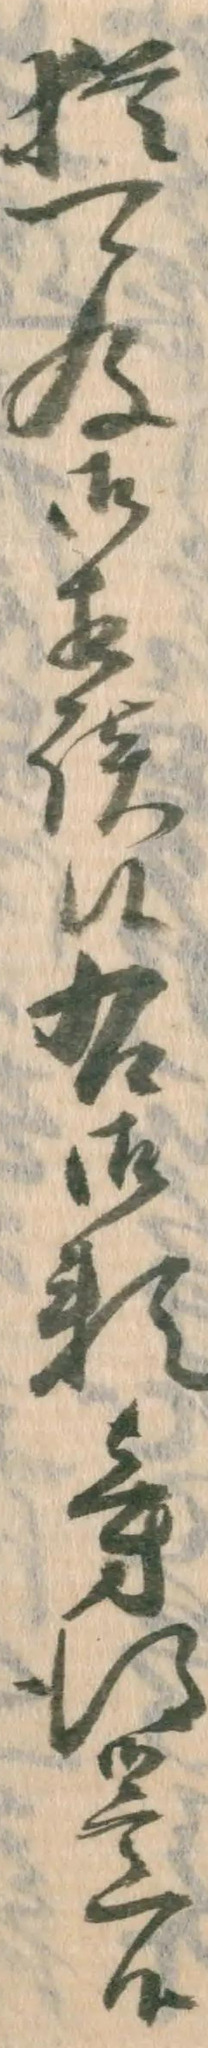猶可及御相談候右御頼旁得御意候
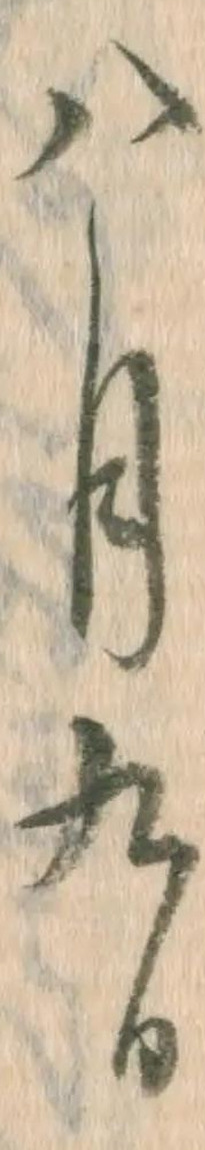八月九日
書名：七十冊物類集 71巻. [44] 四十三 牢屋敷御普請御修覆地震ニ付骨折候牢屋掛御褒美之部
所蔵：国立国会図書館 National Diet Library, JAPAN
